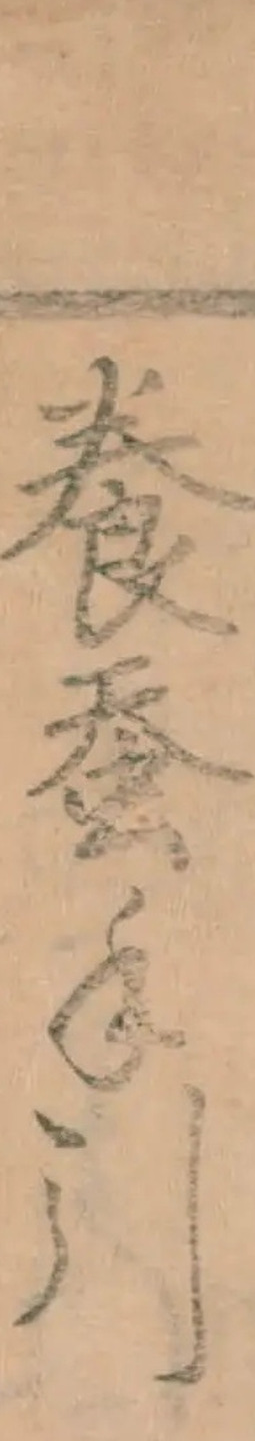養蚕手引
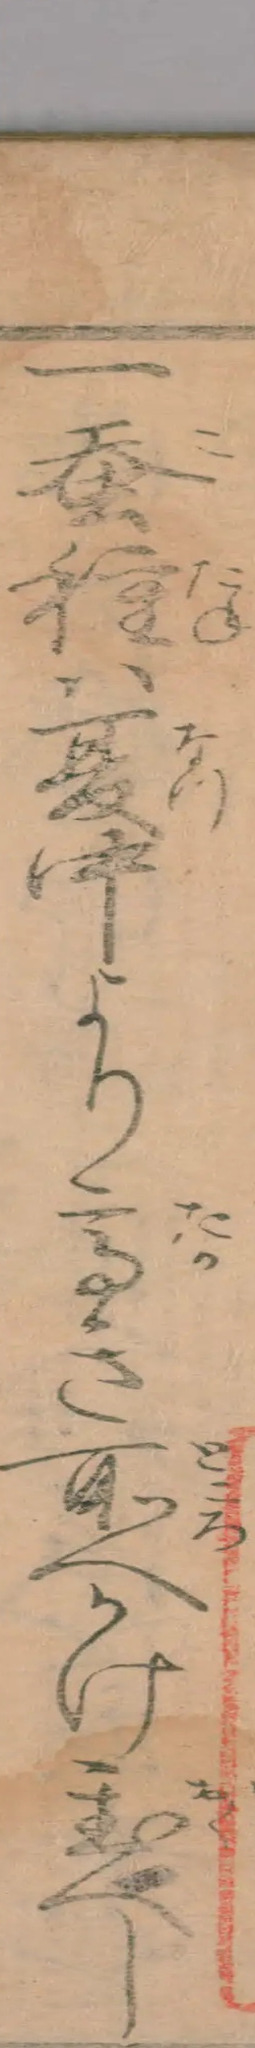一蚕種は夏中より高き所へかけ置べし
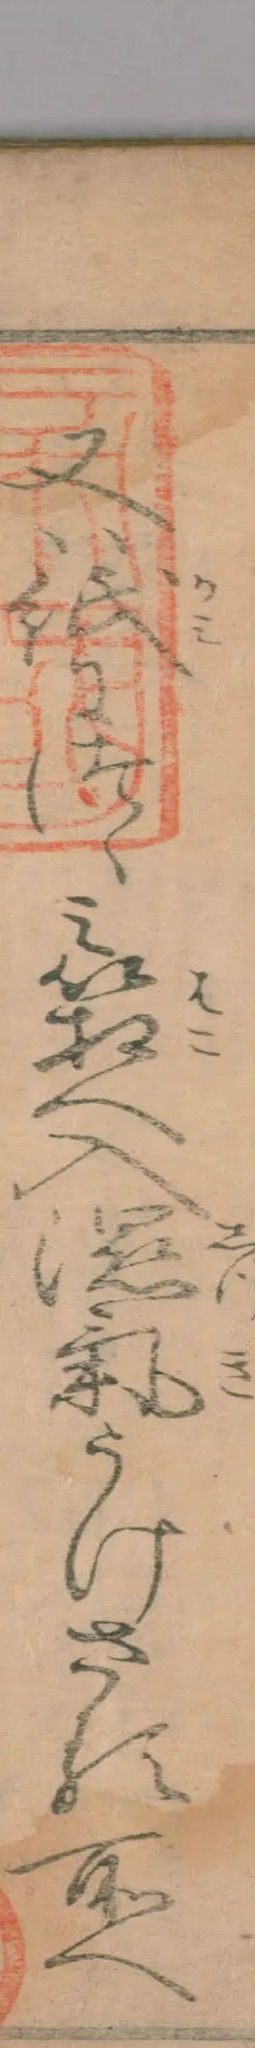又は紙につゝみ箱へ入湿気うけさる所へ
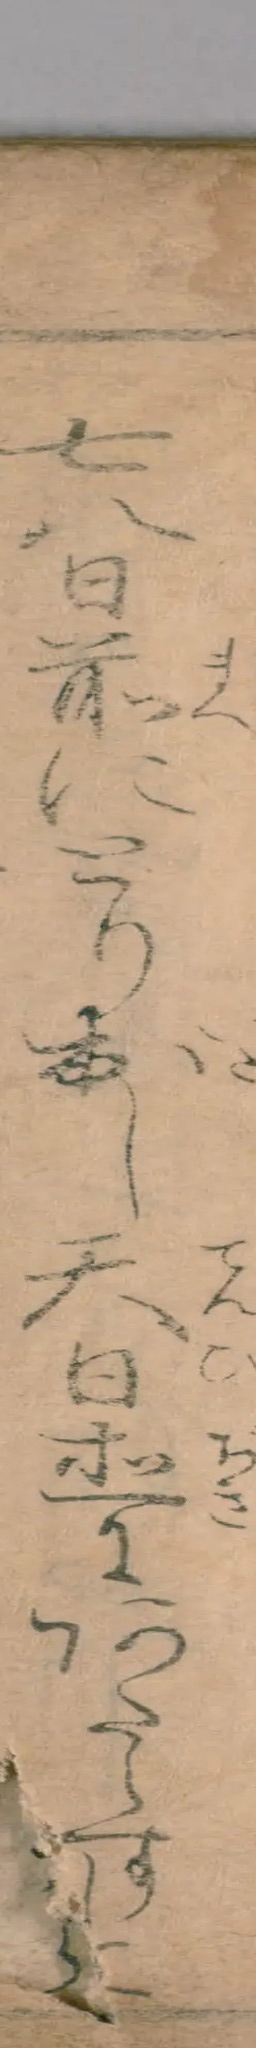七八日前にとり出し天日直にあたらすして
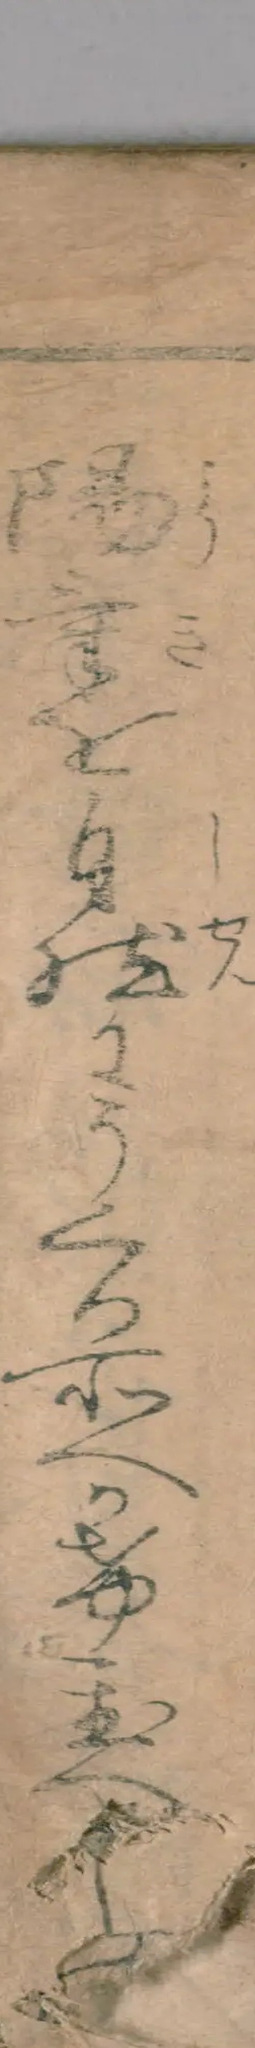陽気を自然にうくる所へかけ置へし

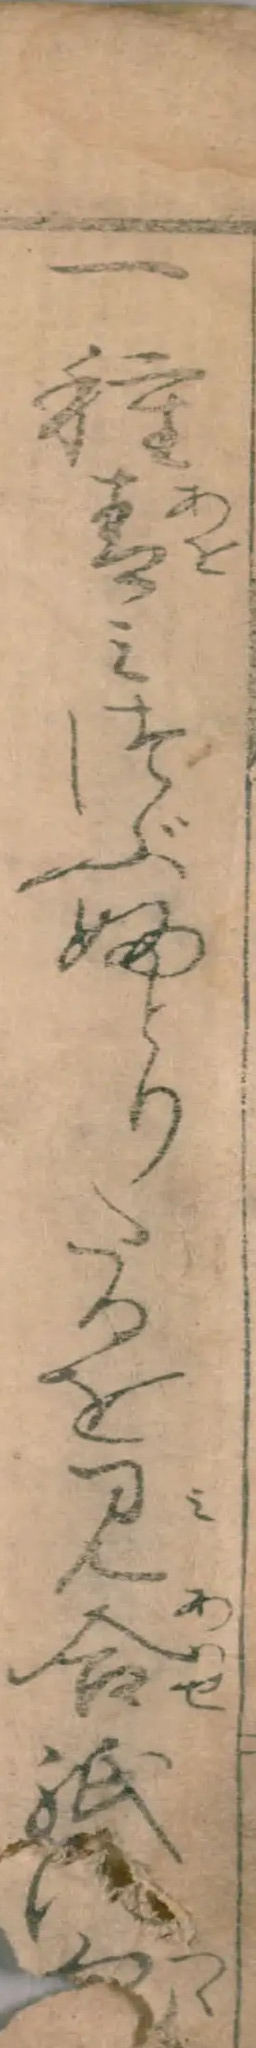一種青みつぶふとりたるを見合紙に包み
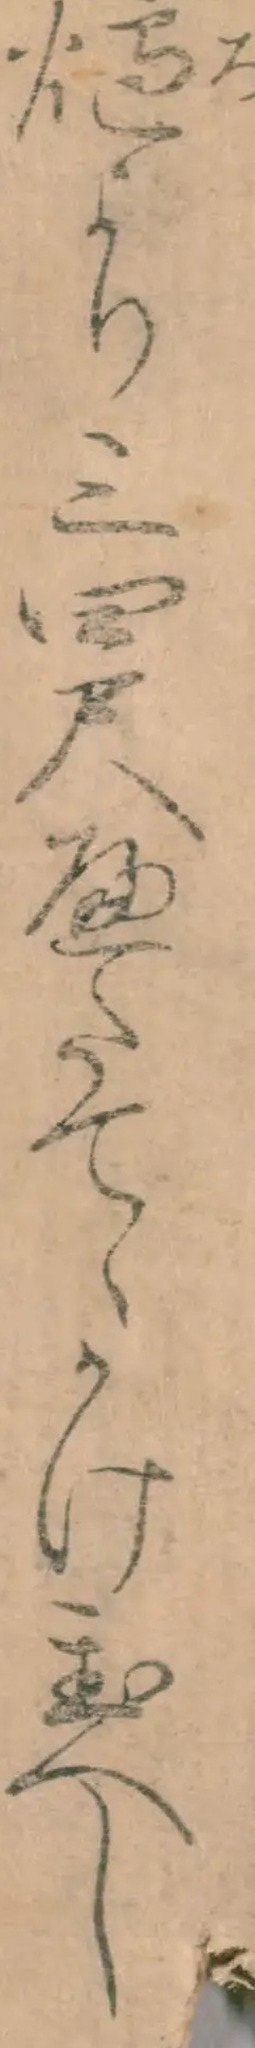炉より三四尺へたてゝかけ置へし
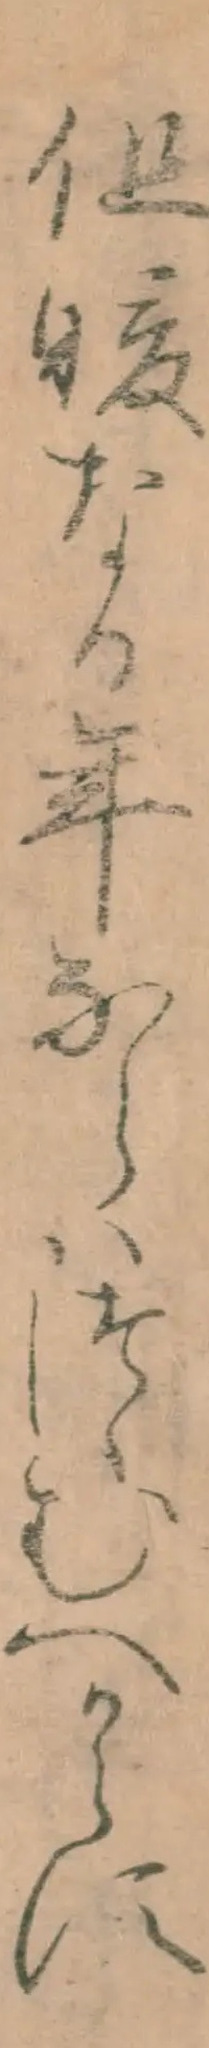但暖なる年ならはつゝむへからす
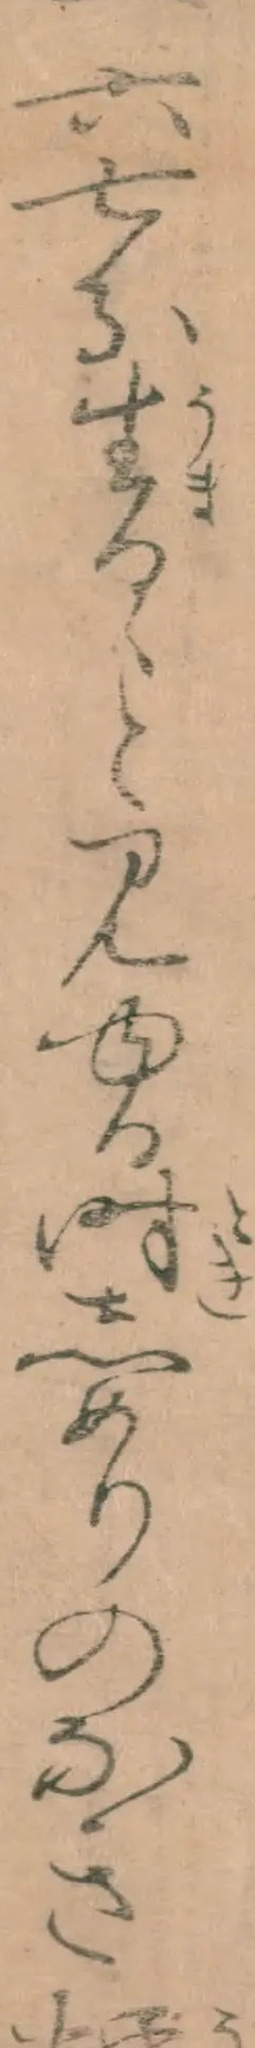一六七分生るゝと見ゆる時しめりのなき粳
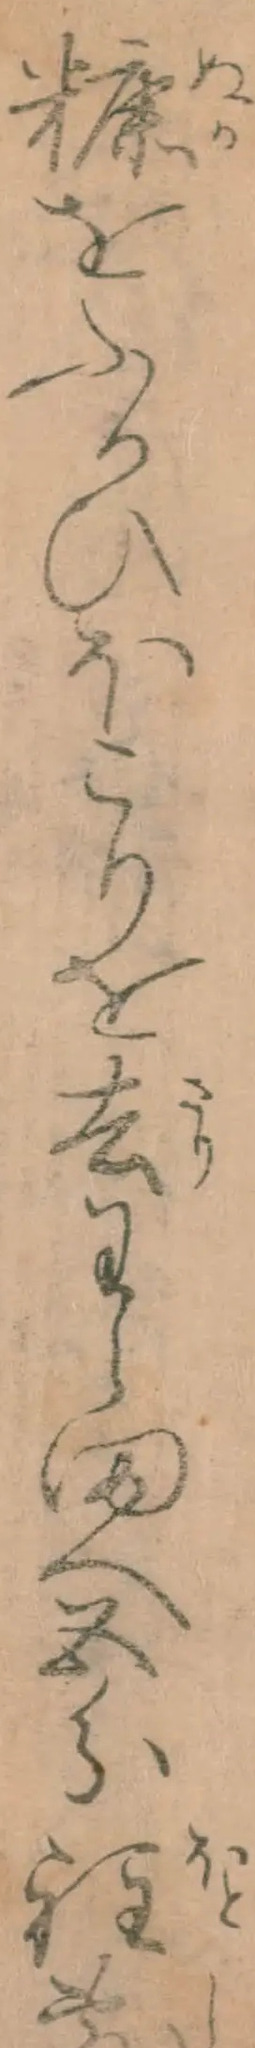糠をふるひほこりを去わら田へ五分程敷
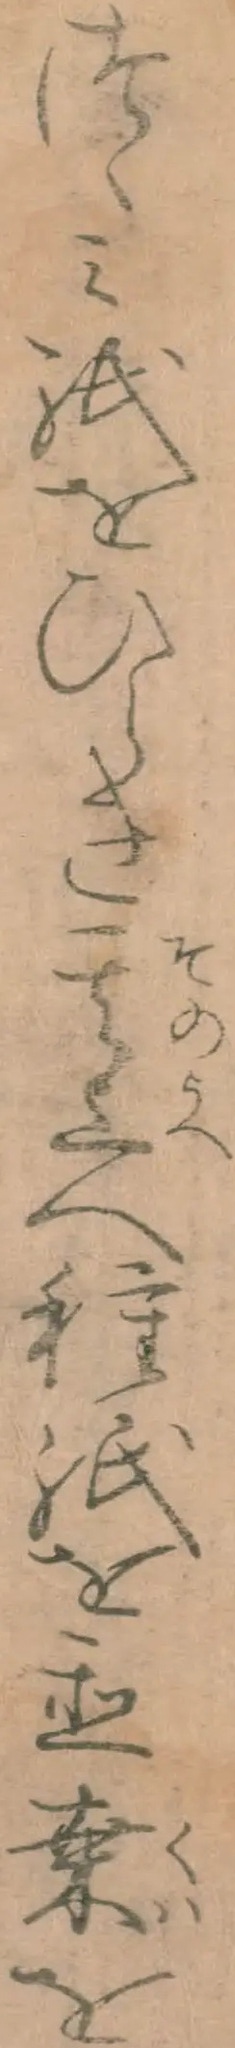つゝみ紙をひらき其上へ種紙を置桑を
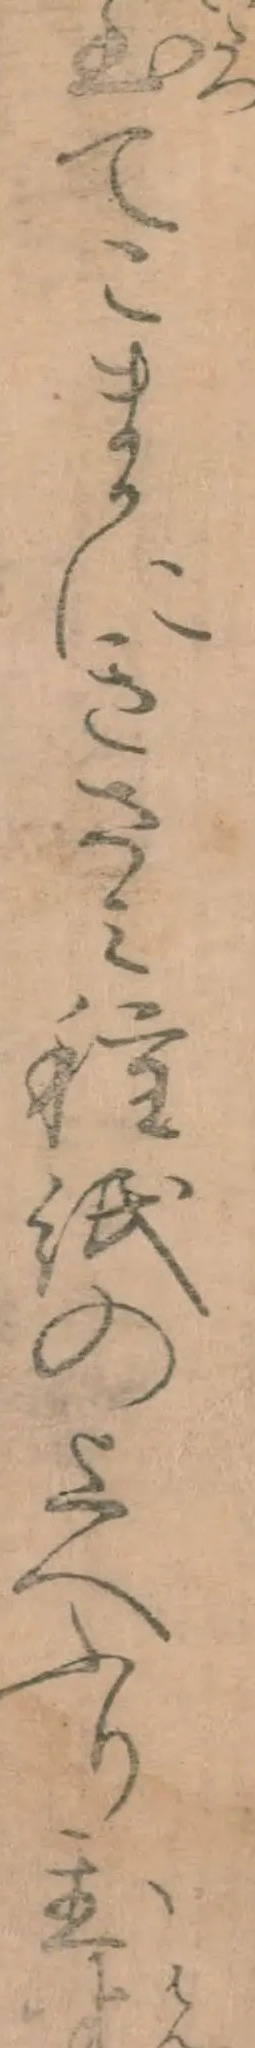至てこまかにきさみ種紙の上へふり置半日
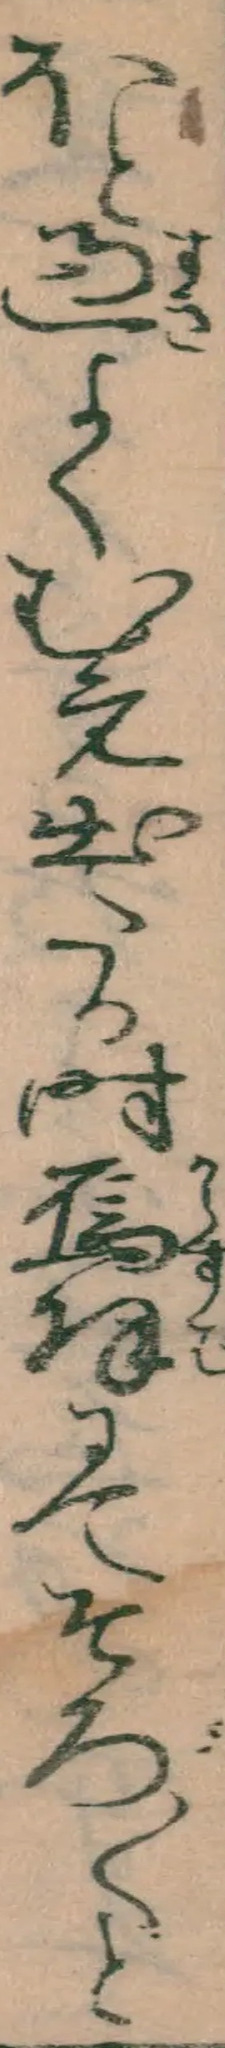ほと過よくむえ出たる時烏羽にてそろ〳〵と
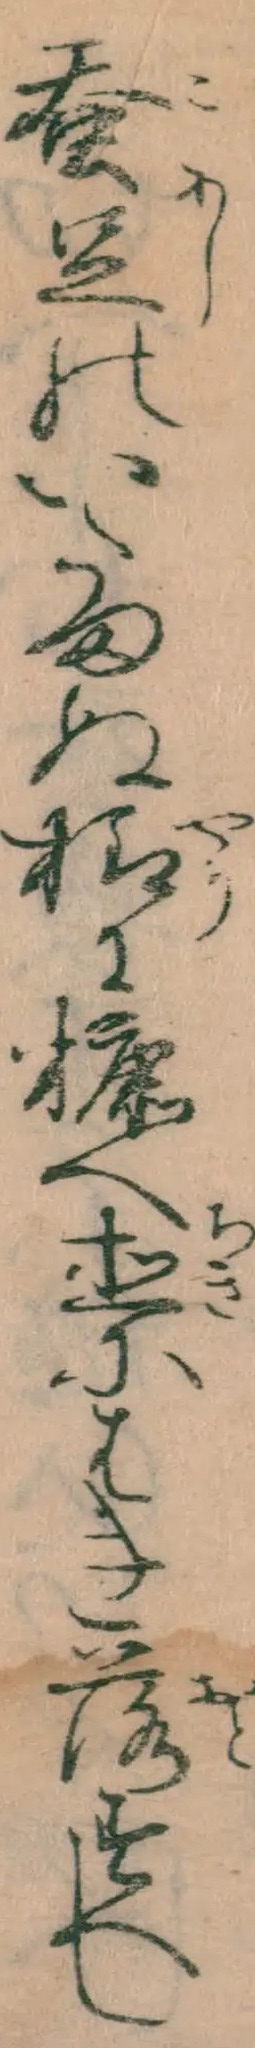蚕足のいたまぬ様に糠へ直にはき落すへし
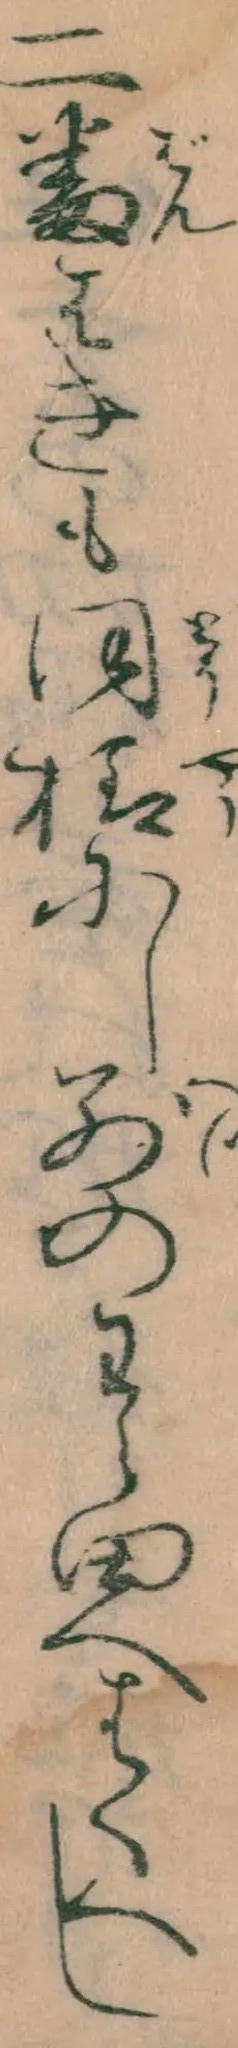二番はきも同様にし別のわら田へはくへし
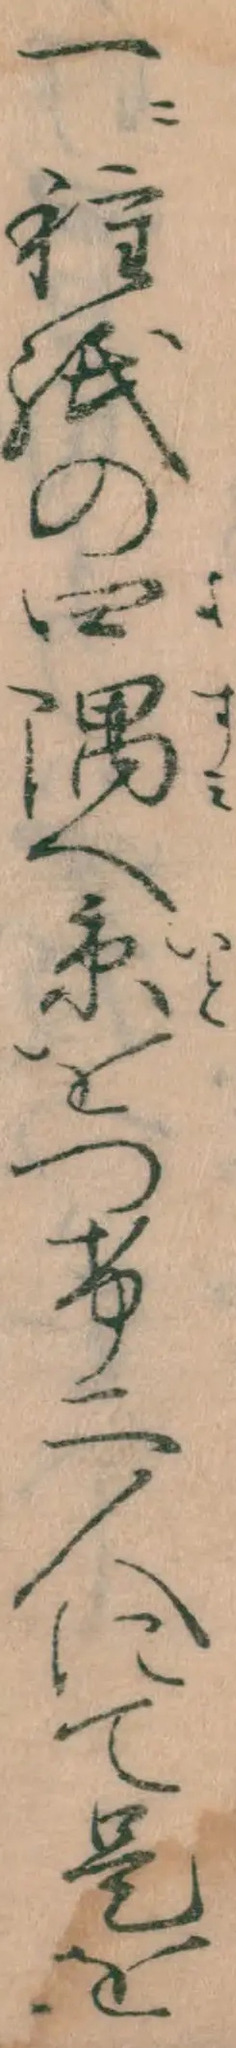一に種紙の四隅へ糸をつけ二人にて是を
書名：養蚕手引
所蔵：国立国会図書館 National Diet Library, JAPAN
